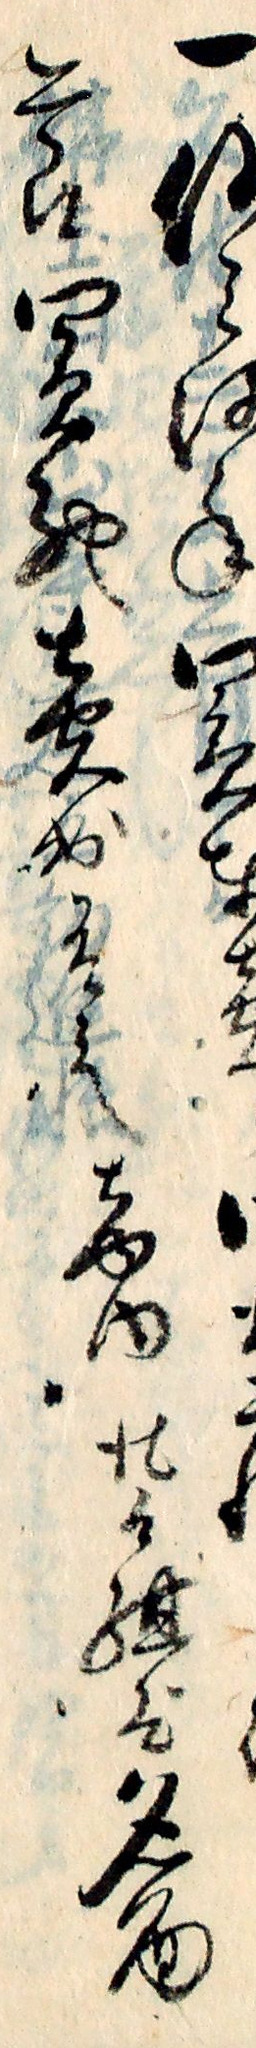節関西へ売出有之商内仕候紺屋名面
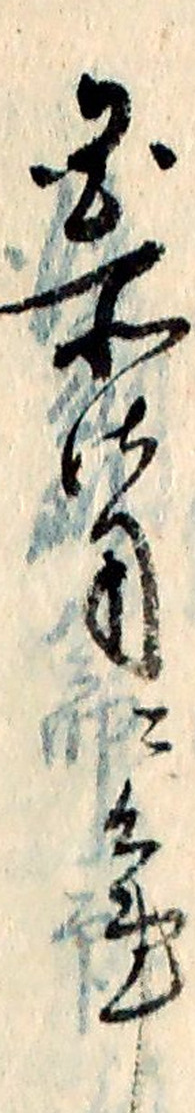国所御用に候事
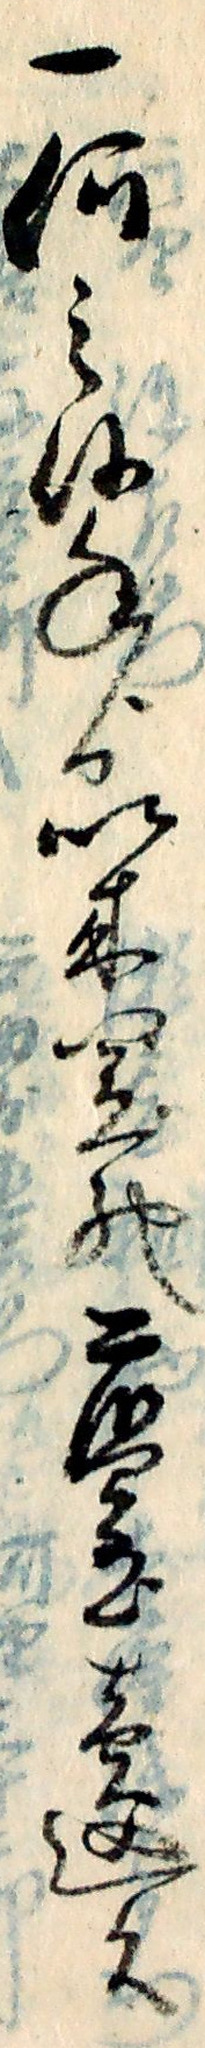一何之何年ゟ以来関西へ藍玉売込候
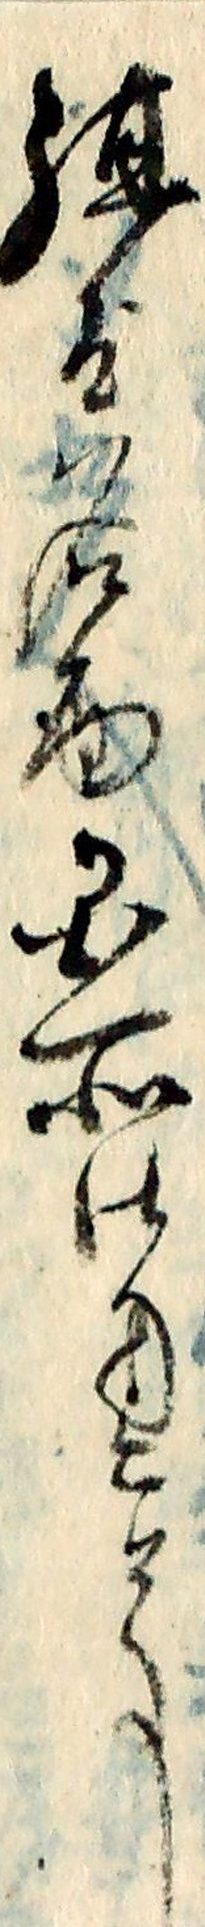紺屋名面国所御用に候事
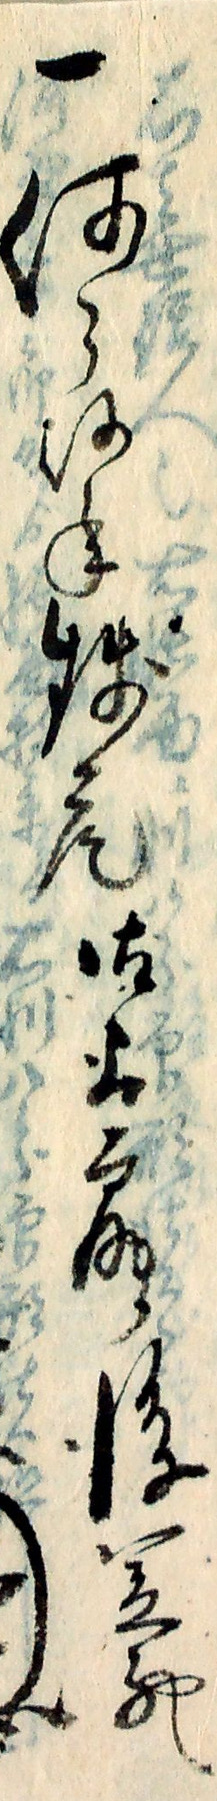一何之何年残尻御取究り後関西へ
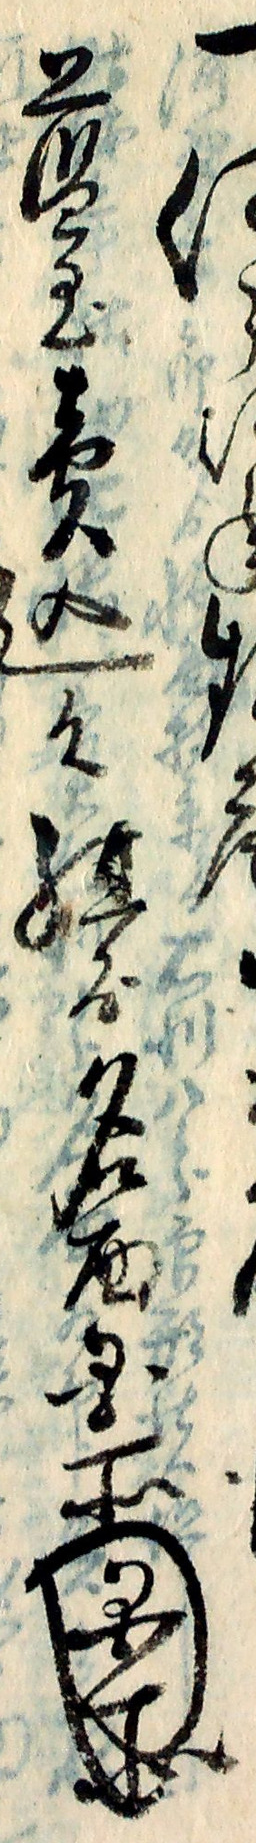藍玉売込候紺屋名面国所
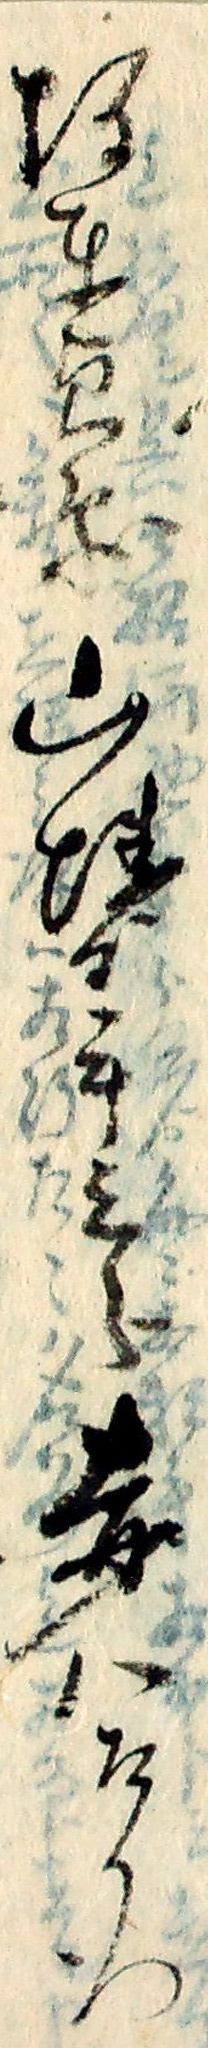坂東貞兵衛山城屋平三郎赤八左衛門
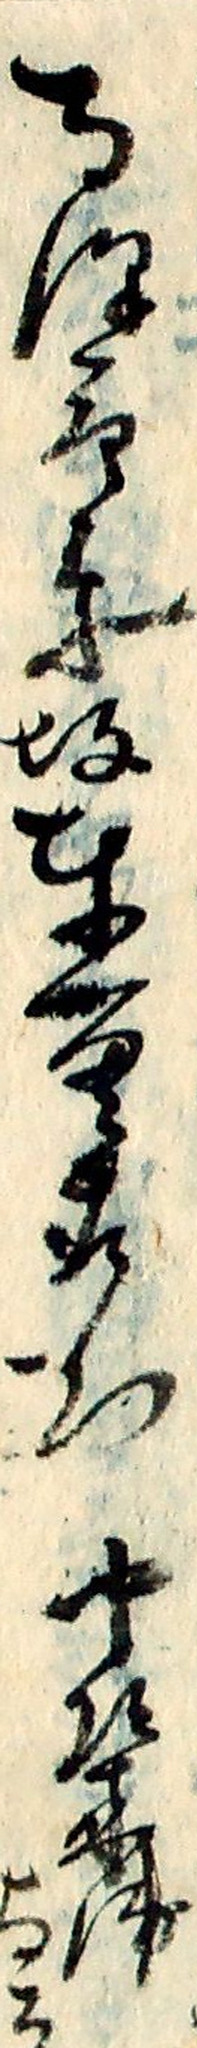寺沢序兵衛坂東曽左衛門中喜来浦
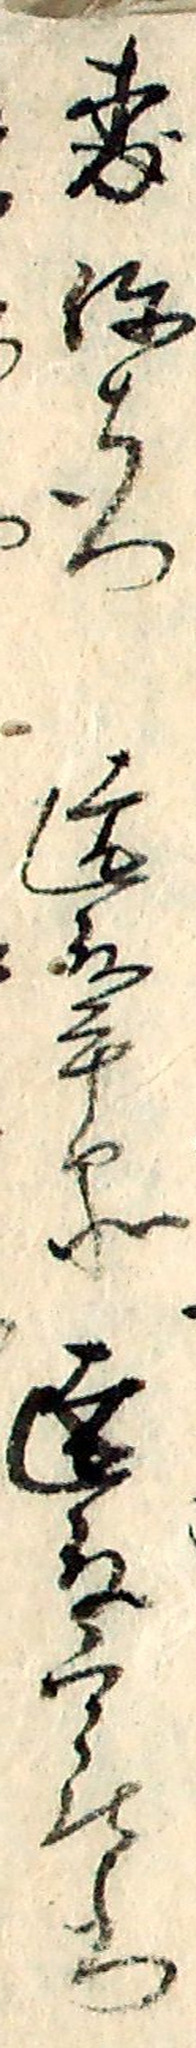森弥右衛門遠藤平兵衛賀六兵衛

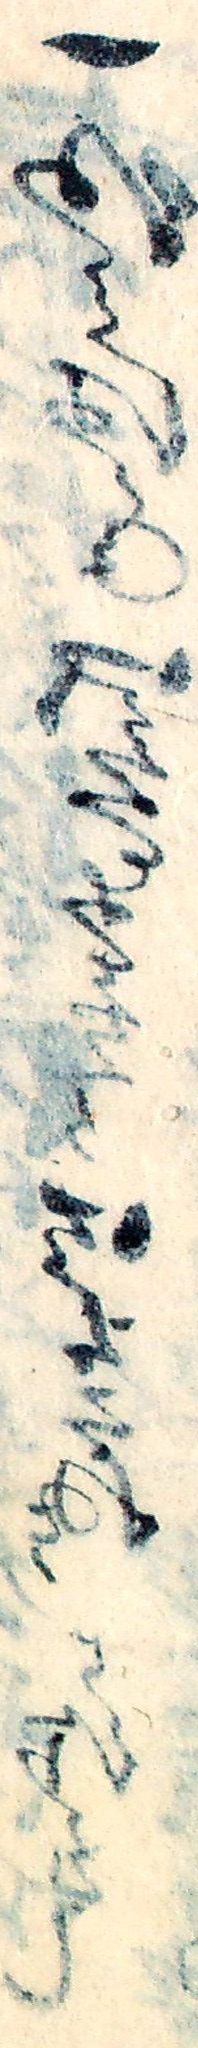亥六月十日
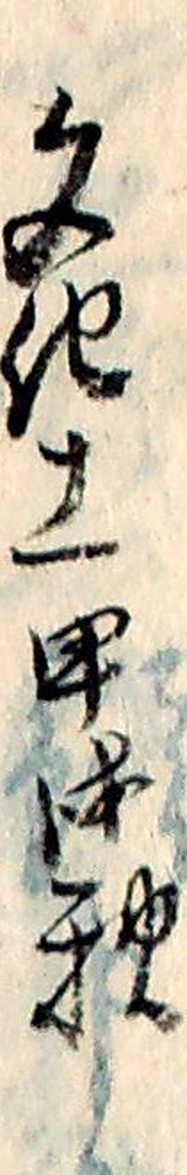文化十一甲戌秋
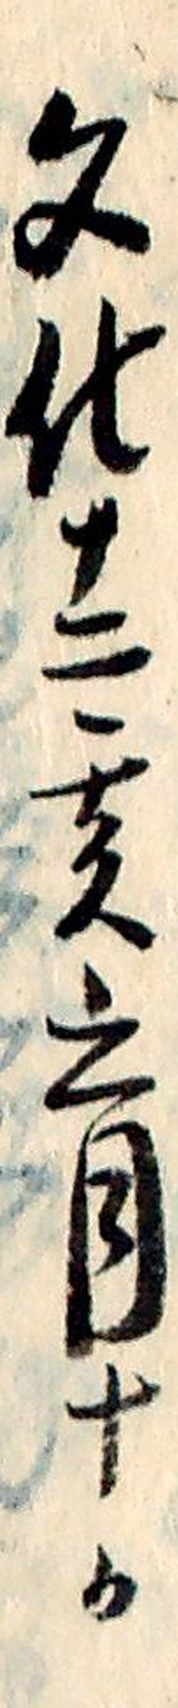文化十二亥六月十日
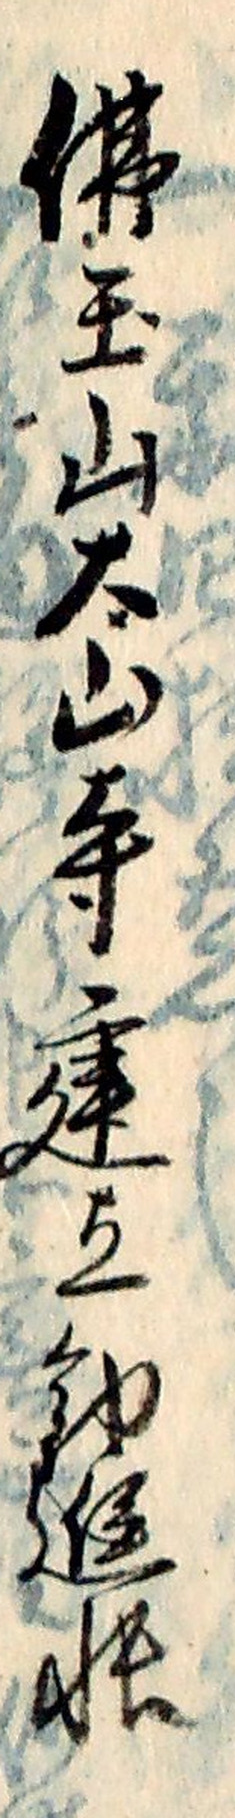仏王山大山寺建立勧進帳
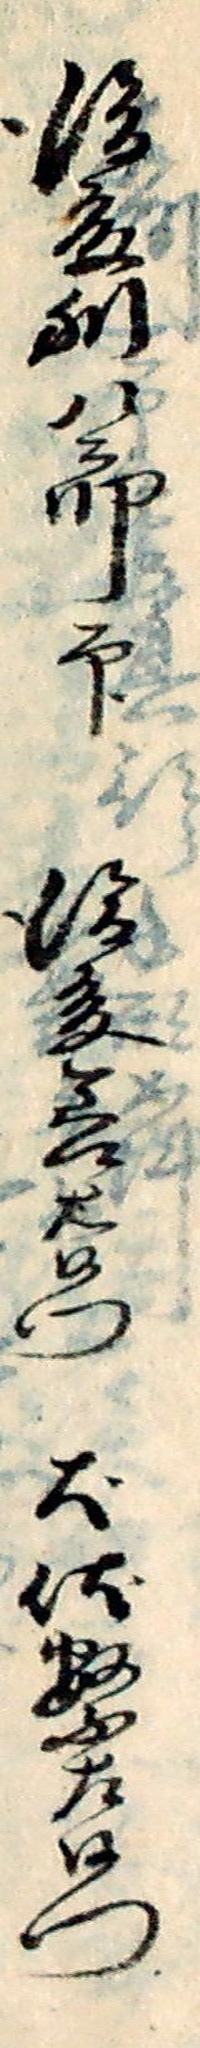後藤利八郎印後藤善右衛門犬伏繁左衛門
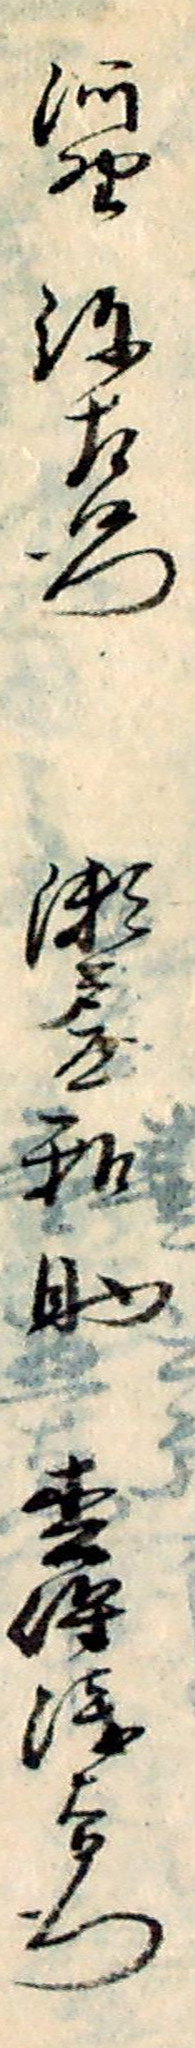河野弥左衛門瀬戸屋和助松保浅右衛門
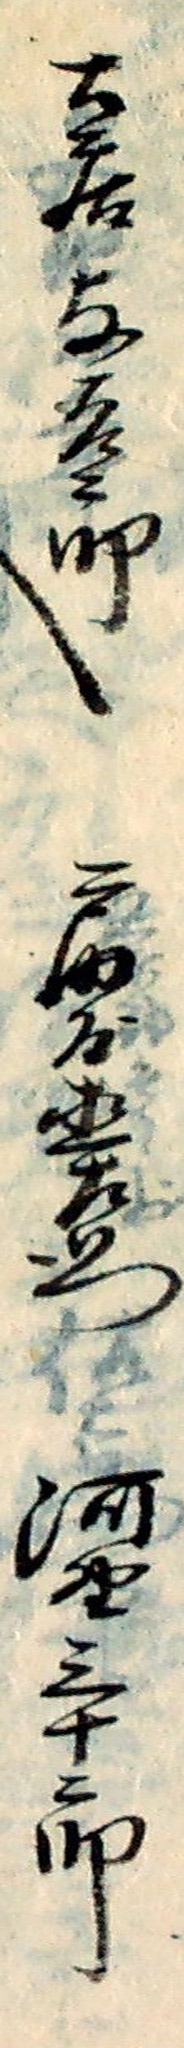土居与吉郎戸田屋直左衛門河野三十郎
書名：諸御願書控(後藤氏壱番）
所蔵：鳴門教育大学 Naruto University of Education
